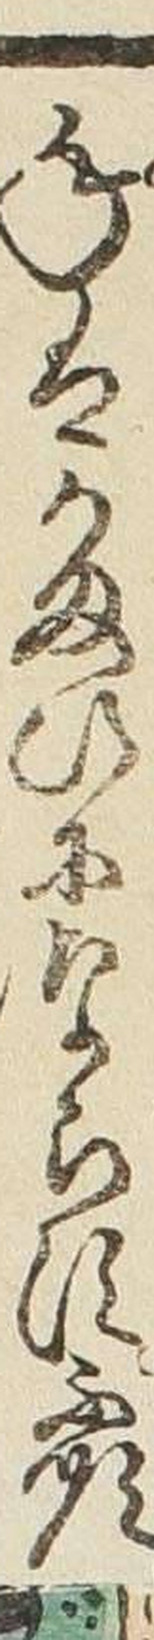年はかまひにならす。不順
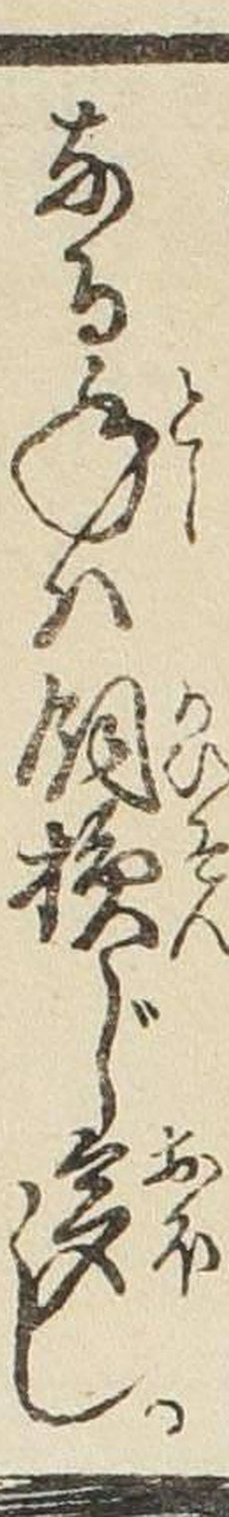なる年は飼損じ多し。
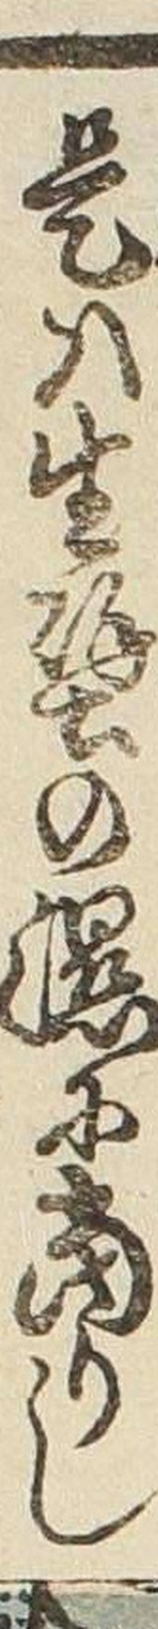是は生壁の湿に当りし
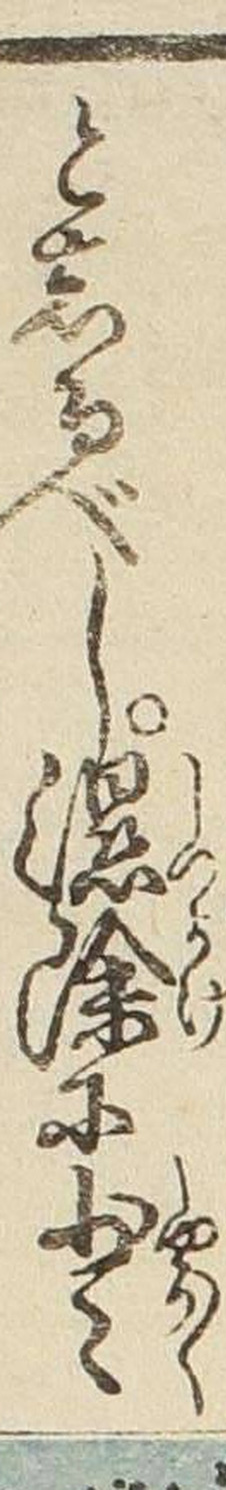としるべし。湿徐に少々
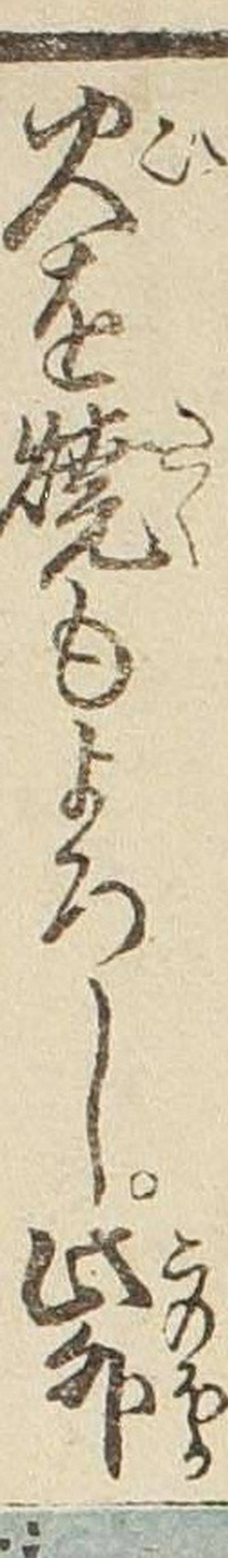火を焼もよろし。此外
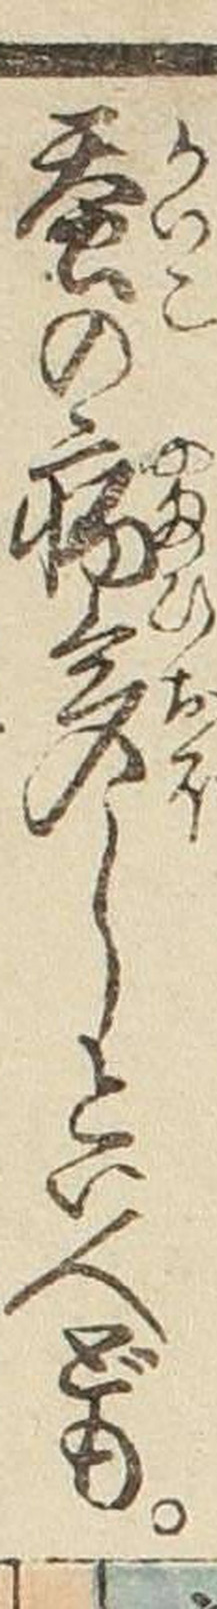蚕の病多しといへども。
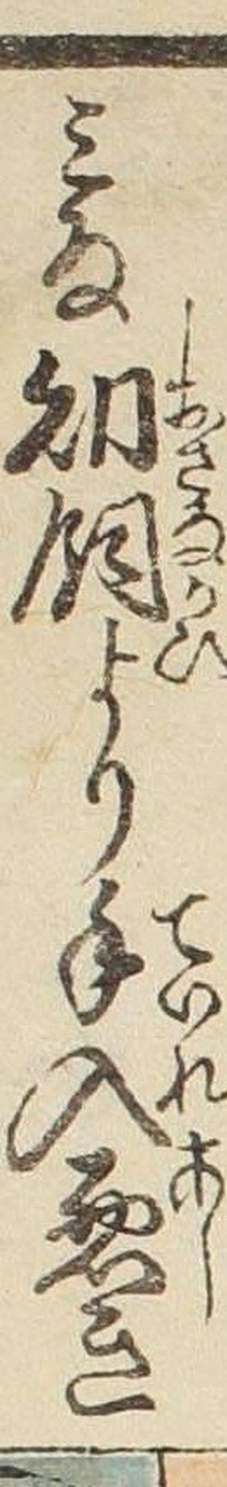みな幼飼より手入悪き
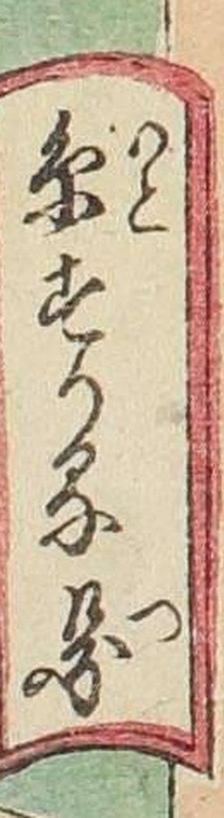糸すかる図

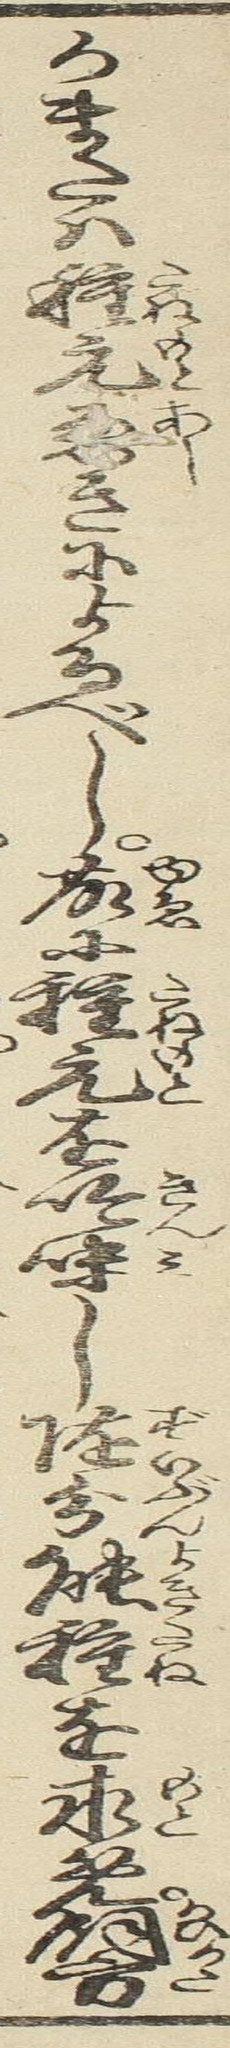かまたは種元悪きによるべし。故に種元を吟味し随分能種を求め。飼方
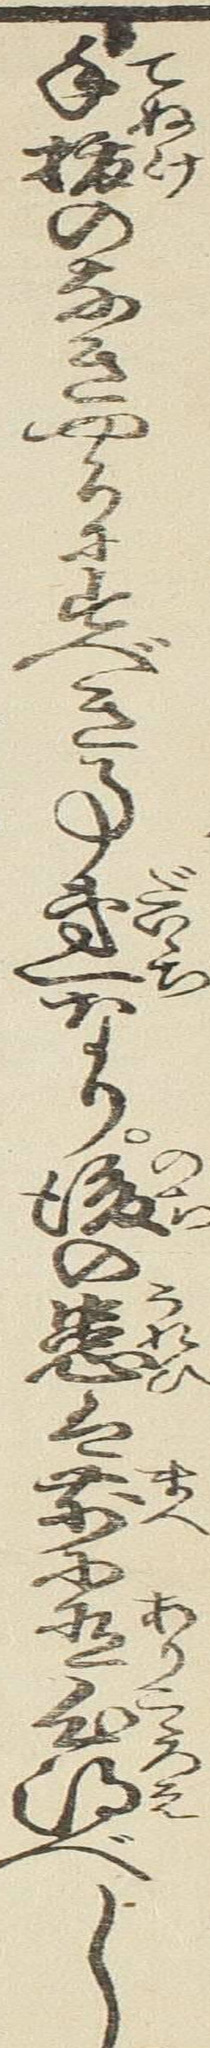手抜のなきやうにすべき事第一なり。後の患は前に有心得べし。
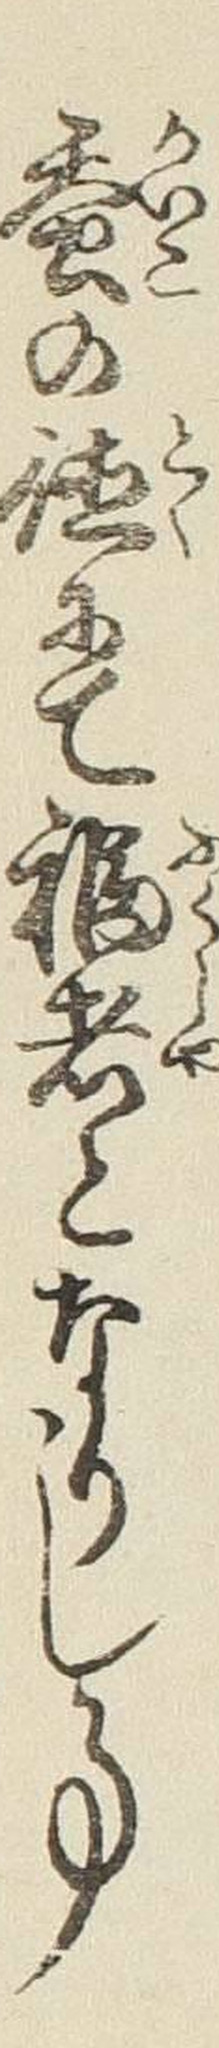蚕の徳にて福者となりし事
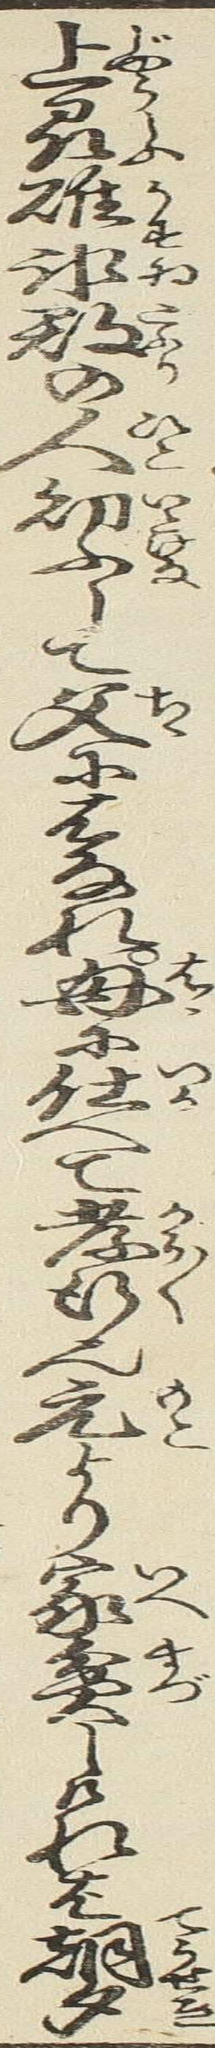上州碓氷郡の人幼ふして父にはなれ。母に仕へて孝行也元より家貧しけれは朝夕
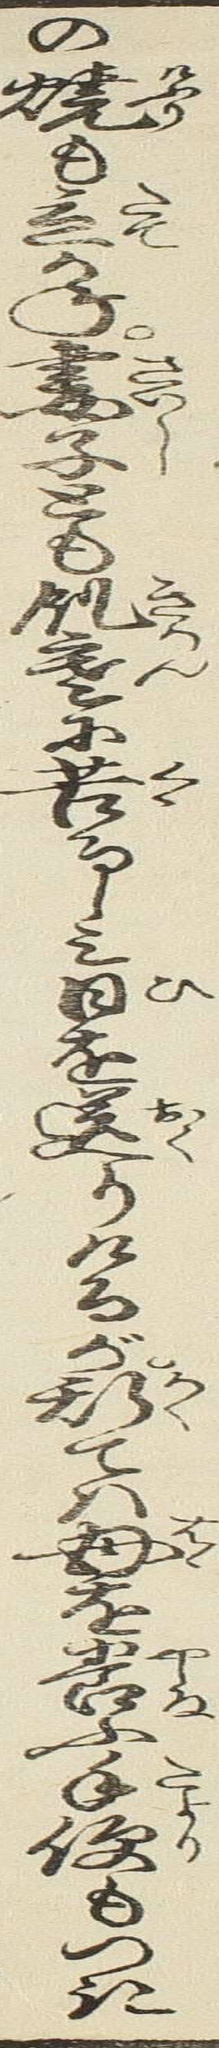の焼も立かね。妻子とも飢寒に苦るしみ日を送りけるが。斯ては母を養ふ手便もつき
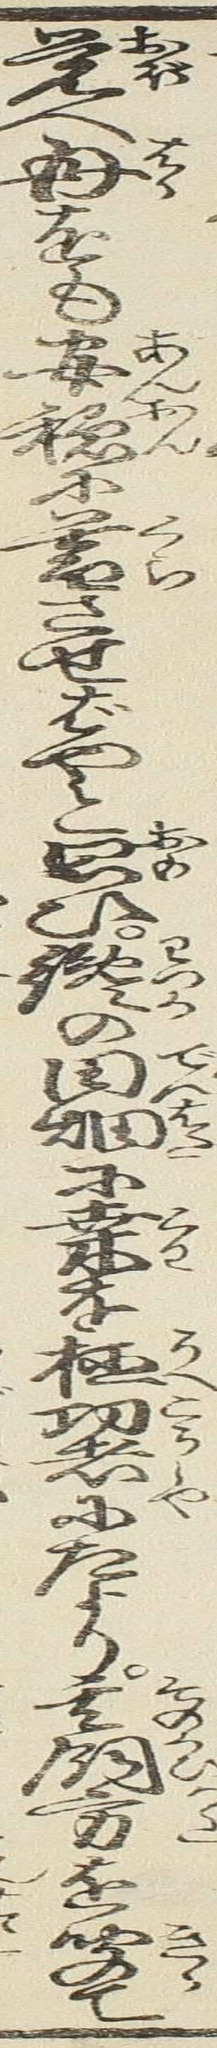覚へ母をも安穏に暮させばやと思ひ。纔の田畑に桑を植功者にたより。其飼方を聞て
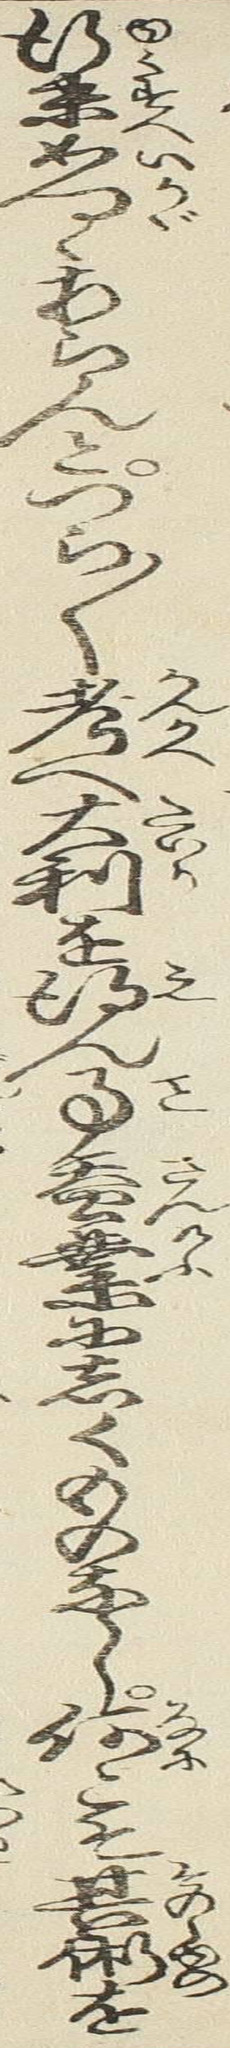行末如何ゝあらんと。つら〳〵考へ大利を得ん事蚕業にしくものなし。何こそ其術を
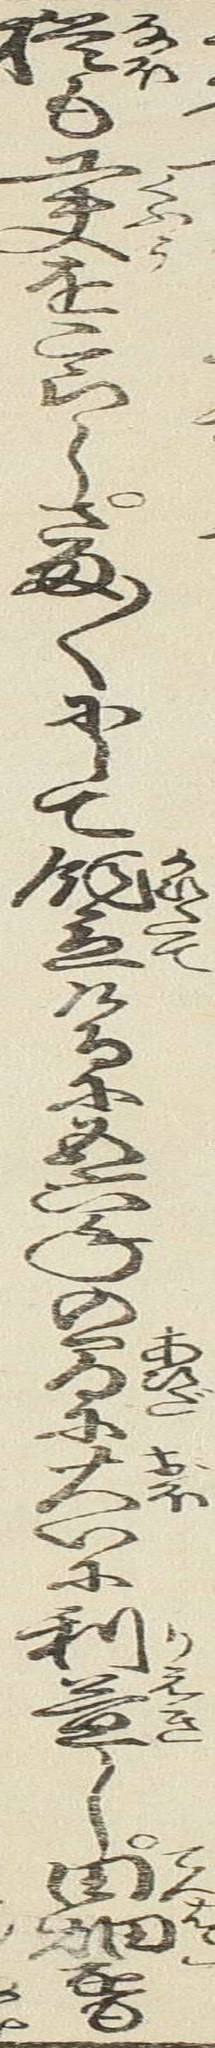猶も工夫をこらし。さま〳〵にして飼立けるに五六年の間に大いに利益し。田畑をも
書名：養蠶圖解
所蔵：東京大学農学生命科学図書館 国文学研究資料館
